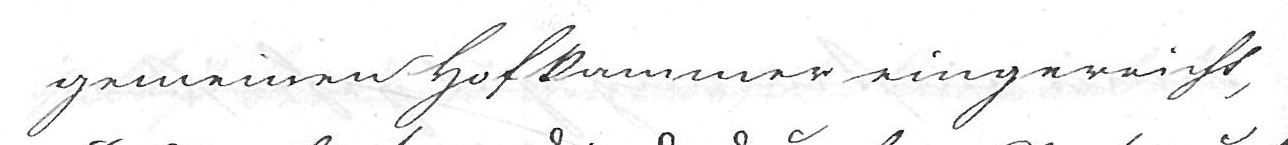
gemeinen Hofkammer eingereicht,
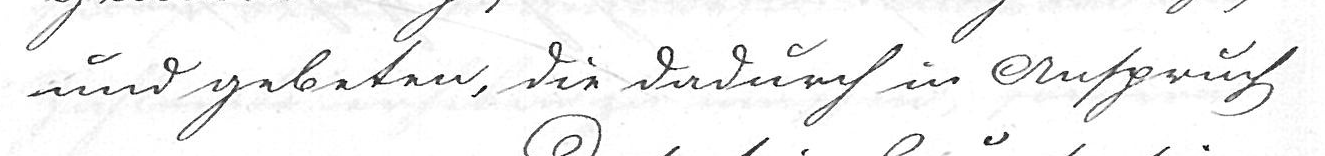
und gebeten, die dadurch in Anspruch
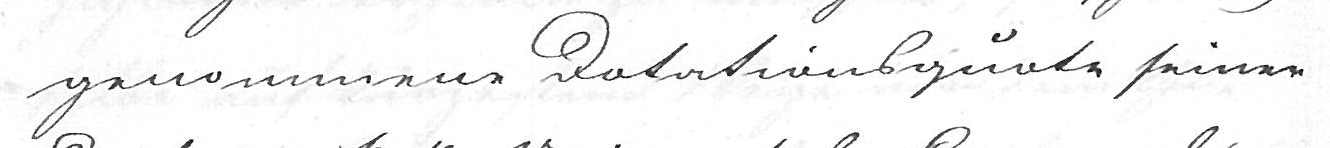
genommene Dotationsquote seiner
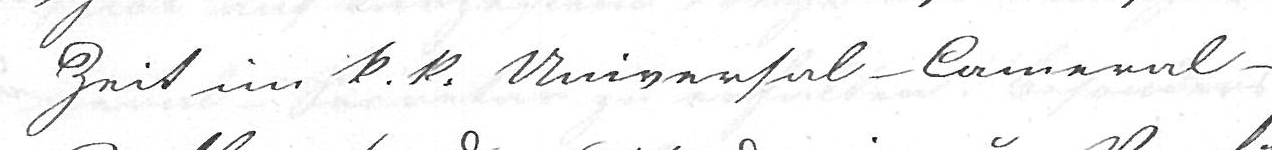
Zeit im k. k. Universal-Cameral-
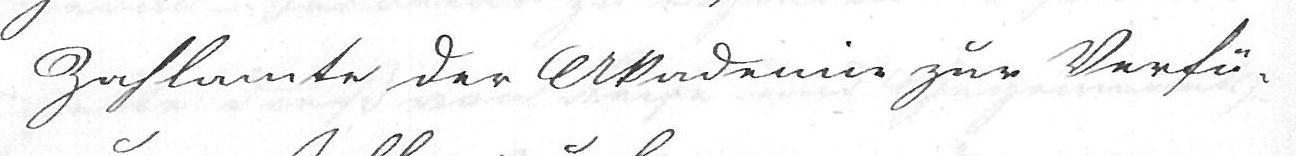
Zahlamte der Akademie zur Verfü-
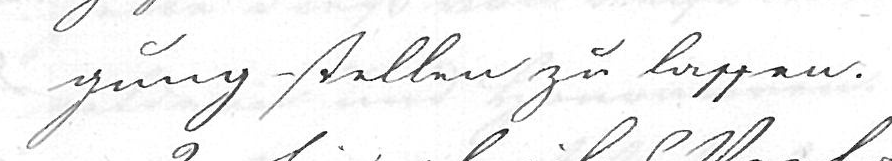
gung stellen zu lassen.
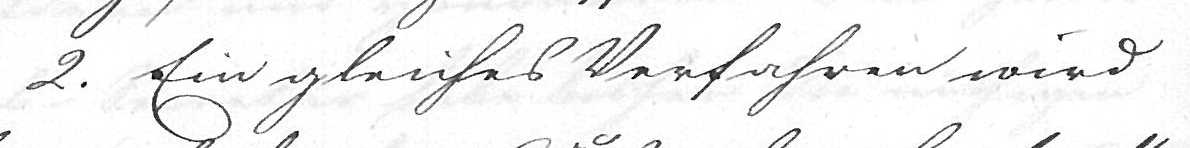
2. Ein gleiches Verfahren wird
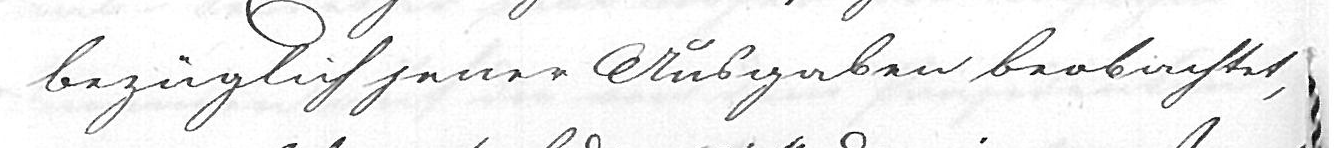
bezüglich jener Ausgaben beobachtet,
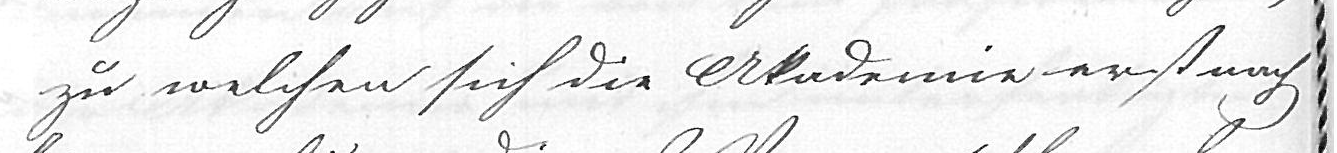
zu welchen sich die Akademie erst nach
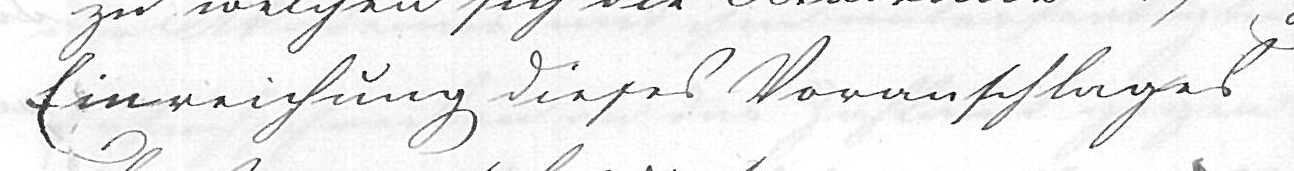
Einreichung dieses Voranschlages
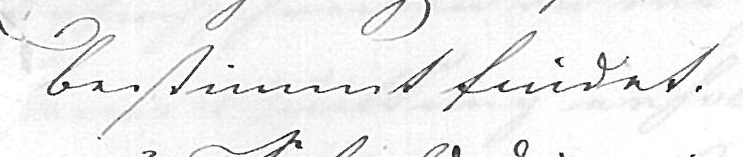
bestimmt findet.
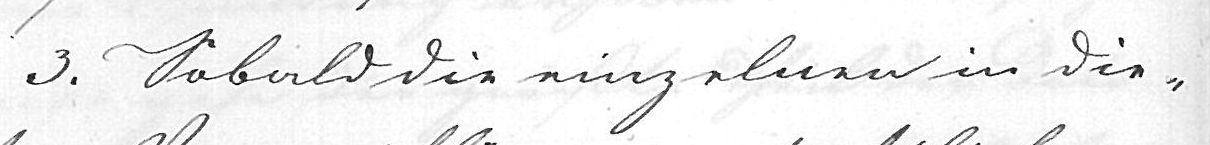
3. Sobald die einzelnen in die-
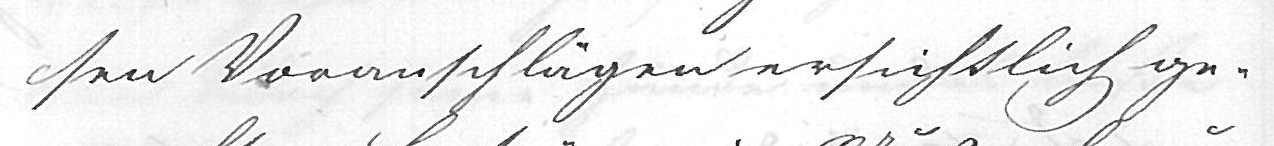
sen Voranschlägen ersichtlich ge-
